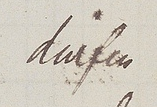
glaube
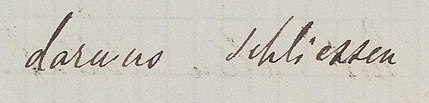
darum schliessen
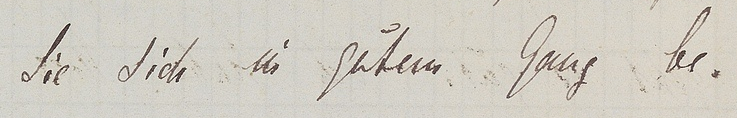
sie sich in gutem Gang be-
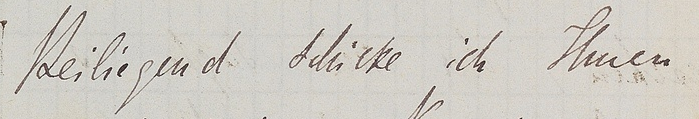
Beiliegend schicke ich Ihnen
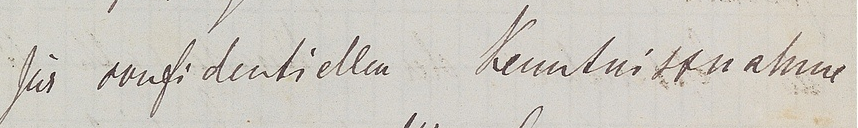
zur confidentiellen Kentnissnahme
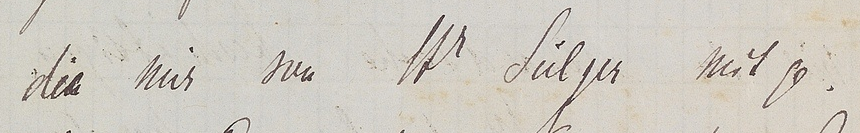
die mir von HrSulzer mitge-
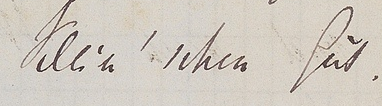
theilte Copie des
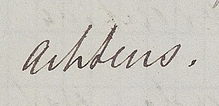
achtens.
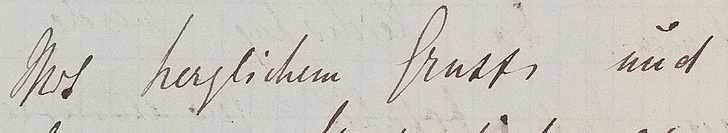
Mit herzlichem Grusse und
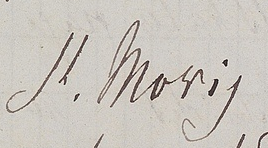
St. Moriz
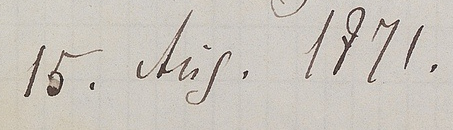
15. Aug. 1871.
